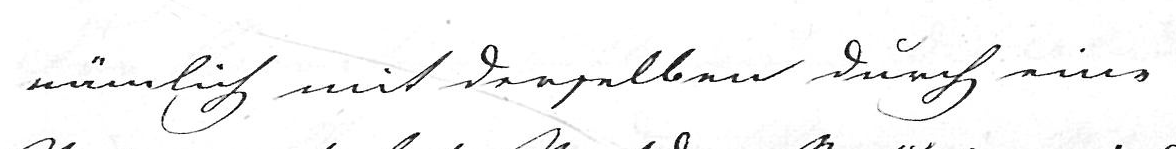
nämlich mit derselben durch eine
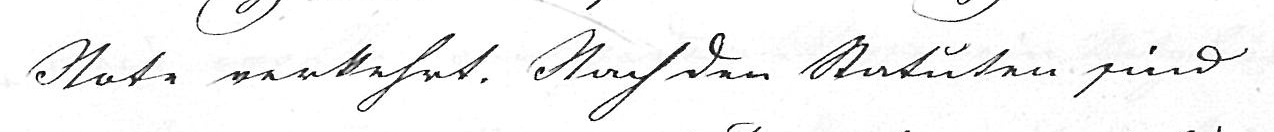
Note verkehrt. Nach den Statuten sind
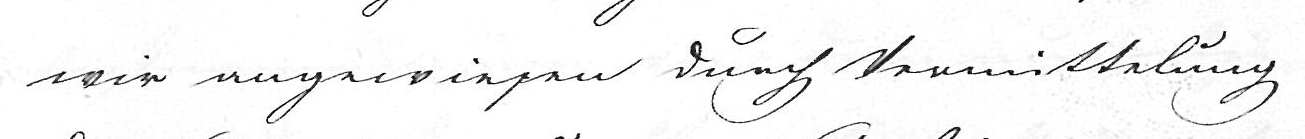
wir angewiesen durch Vermittelung
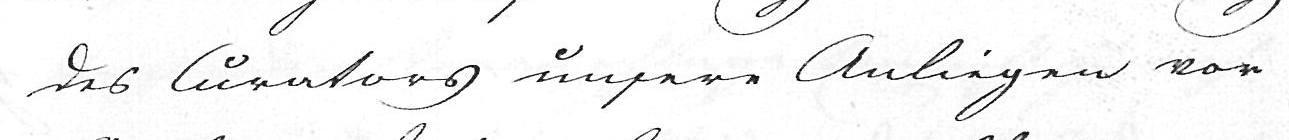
des Curators unsere Anliegen vor
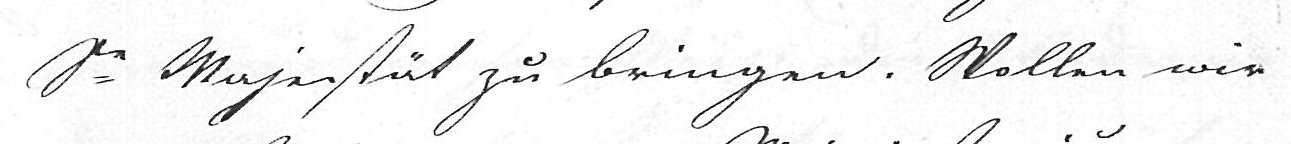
Sr Majestät zu bringen. Wollen wir
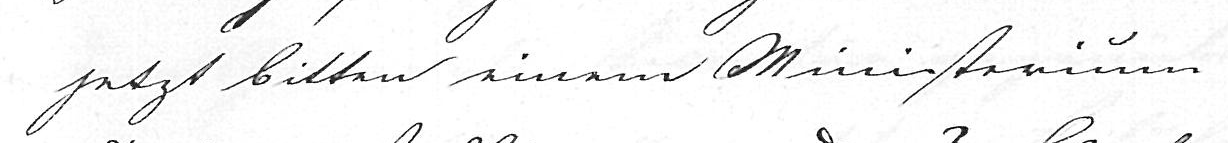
jetzt bitten einem Ministerium
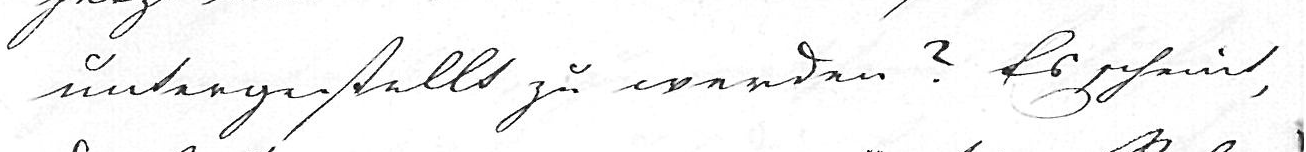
untergestellt zu werden? Es scheint,
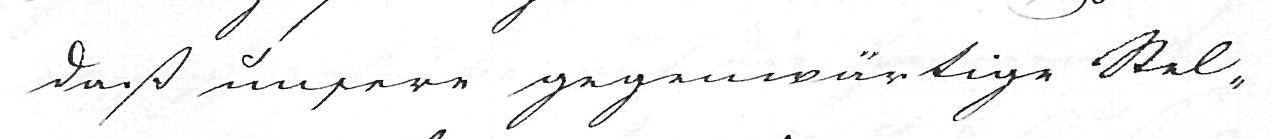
daß unsere gegenwärtige Stel-
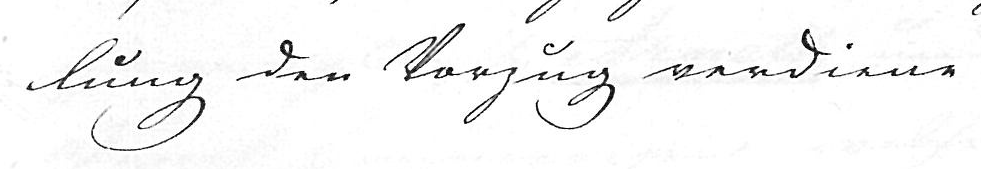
lung den Vorzug verdiene.
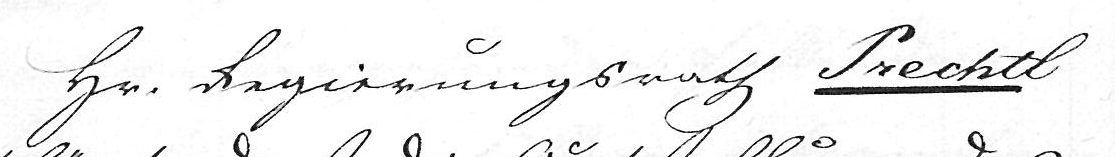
Hr. Regierungsrath Prechtl
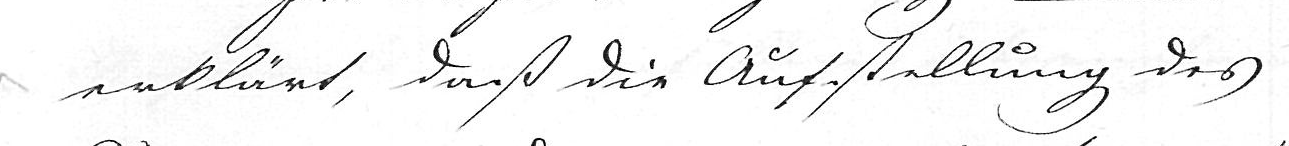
erklärt, daß die Aufstellung des
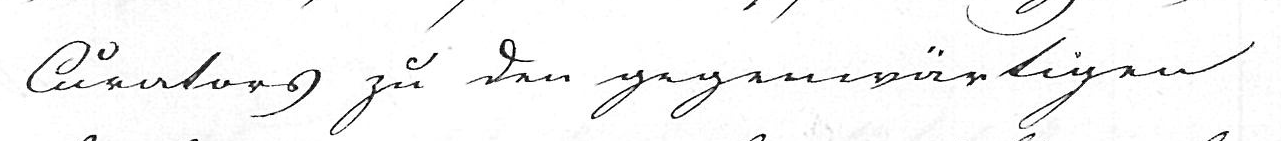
Curators zu den gegenwärtigen
